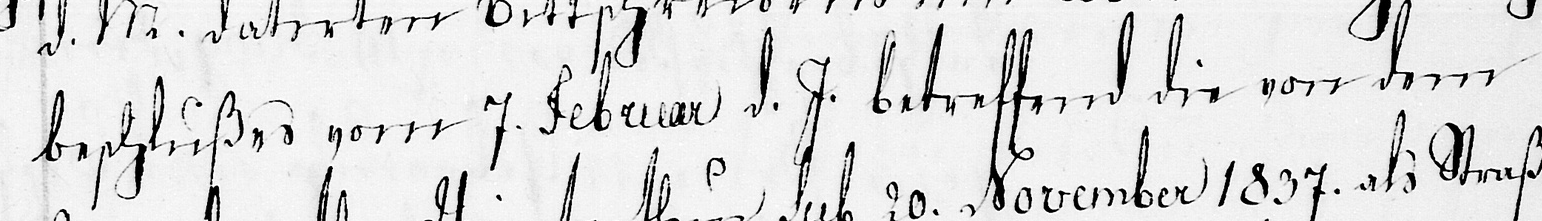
beschlußes vom 7. Februar d. J. betreffend die von dem
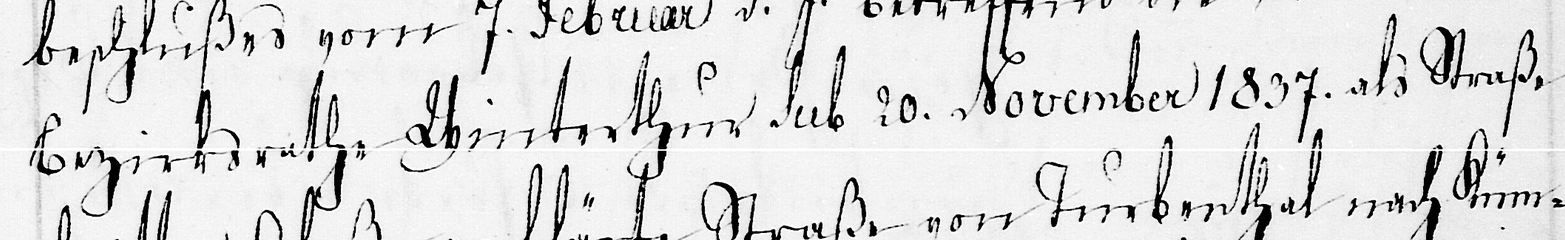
Bezirksrathe Winterthur sub 20. November 1837. als Straße
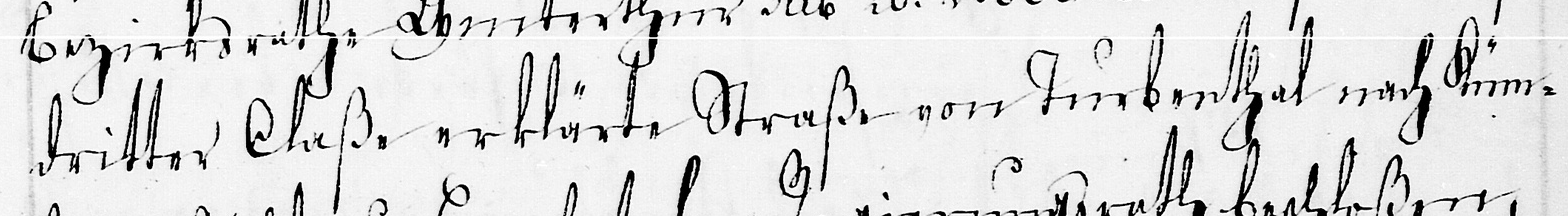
dritter Claße erklärte Straße von Turbenthal nach Küm¬
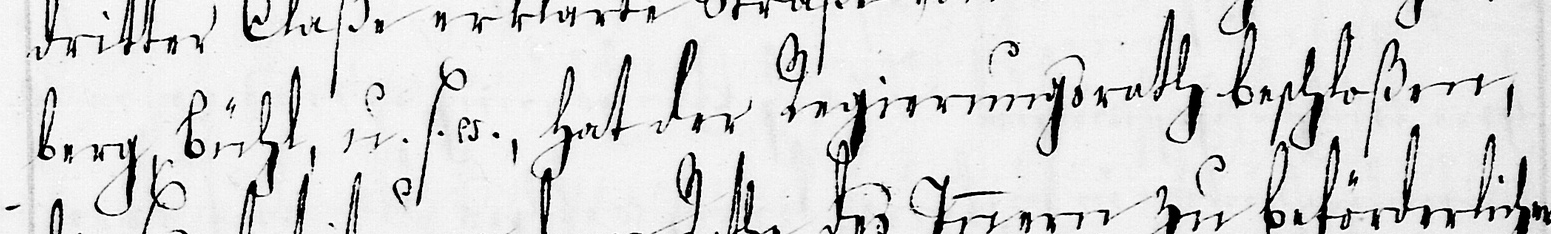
berg, Bühl, u. s. w., hat der Regierungsrath beschloßen,
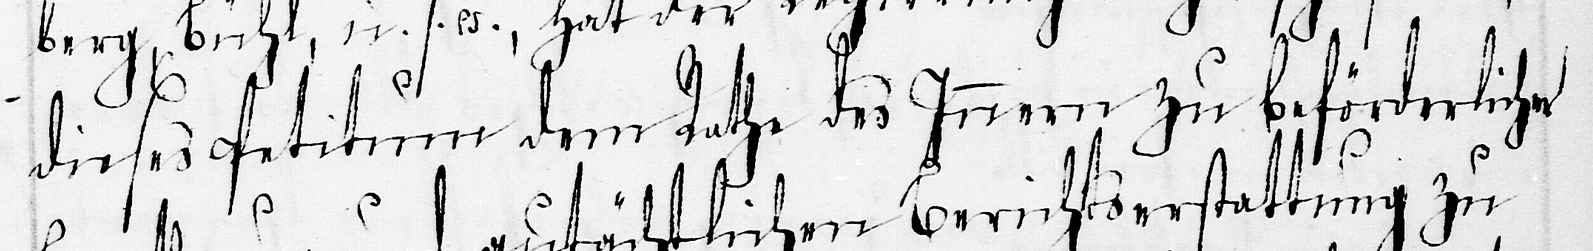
dieses Petitum dem Rathe des Innern zu beförderlicher
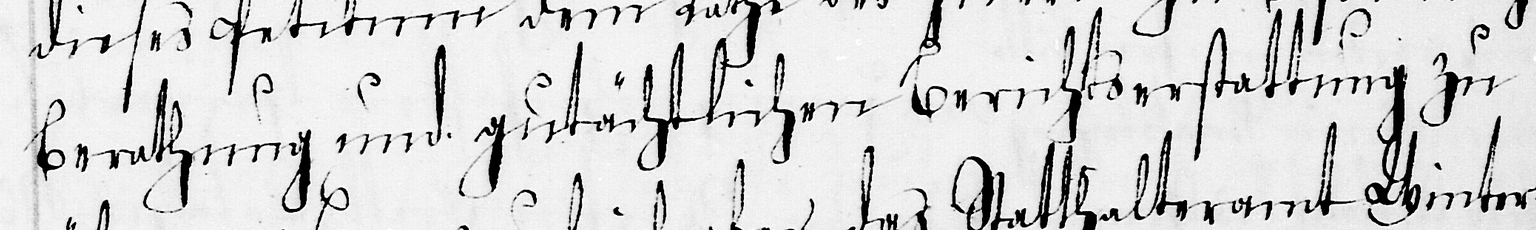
Berathung und gutächtlichen Berichtserstattung zu
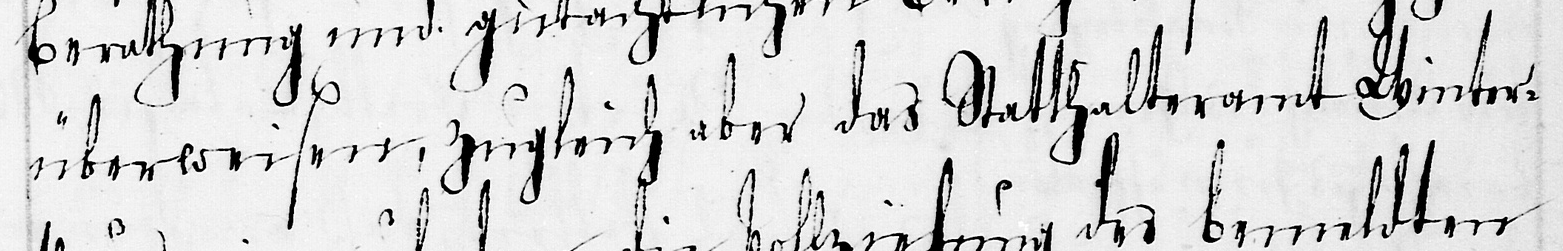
überweisen, zugleich aber das Statthalteramt Winter¬
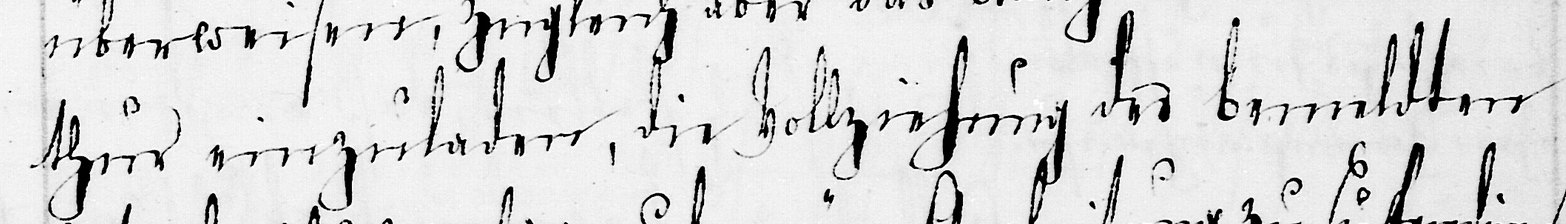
thur einzuladen, die Vollziehung des bemeldten
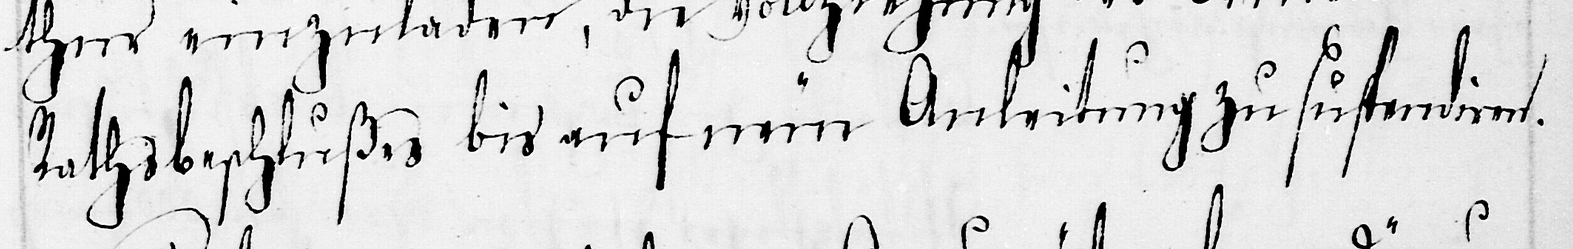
Rathsbeschlußes bis auf neue Anleitung zu suspendiren.
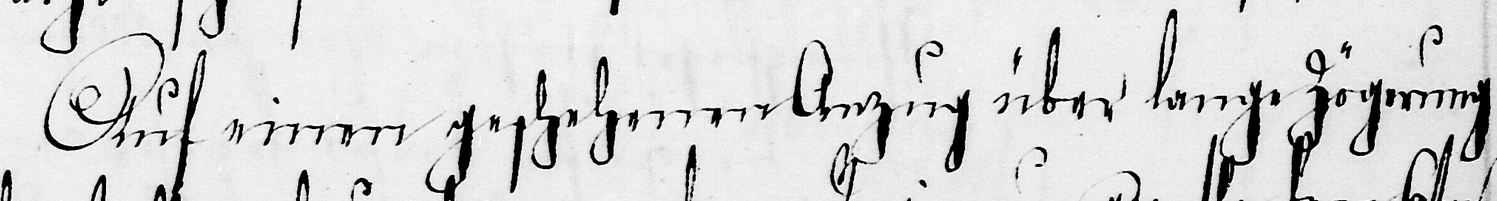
Auf einen geschehenen Anzug über lange Zögerung
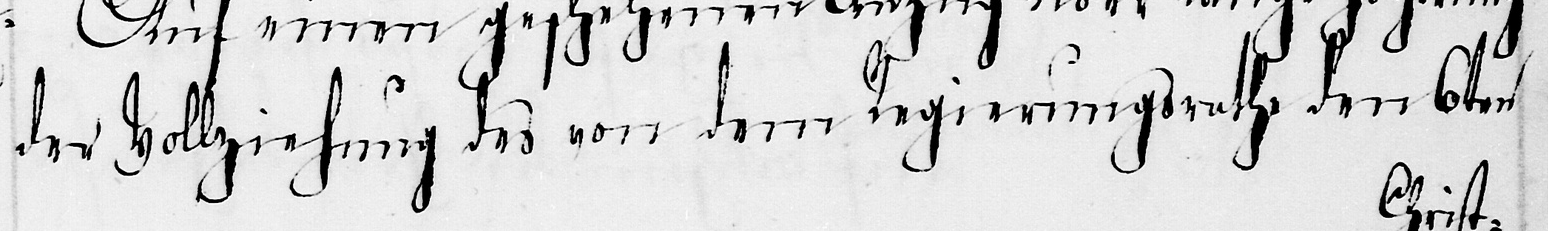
der Vollziehung des von dem Regierungsrathe den 6ten
